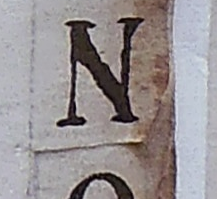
N
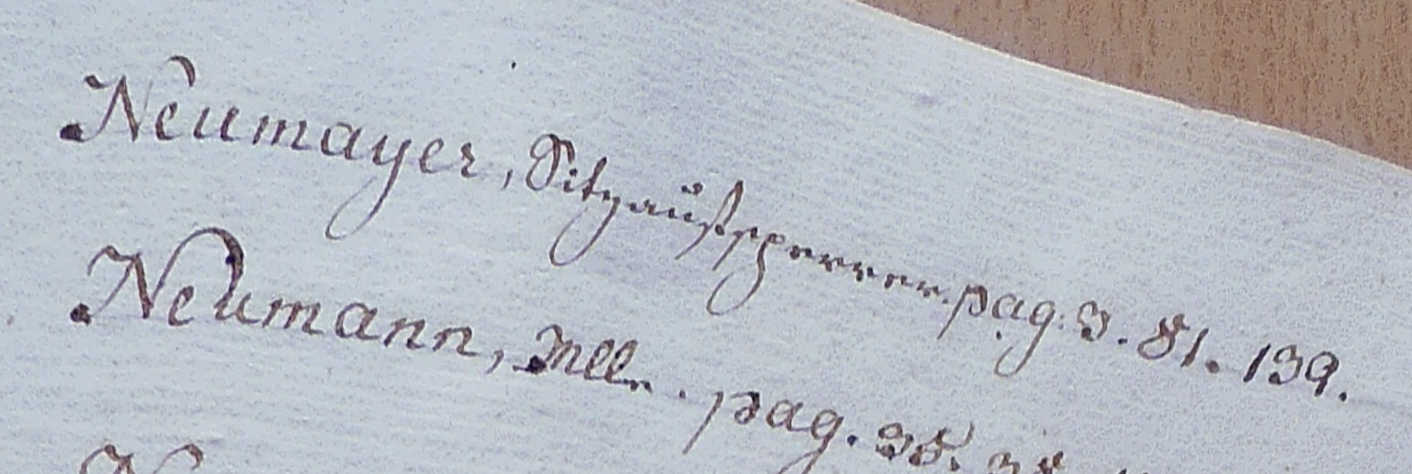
Neumayer, Sitzaufsperrer. pag. 3. 81. 139.
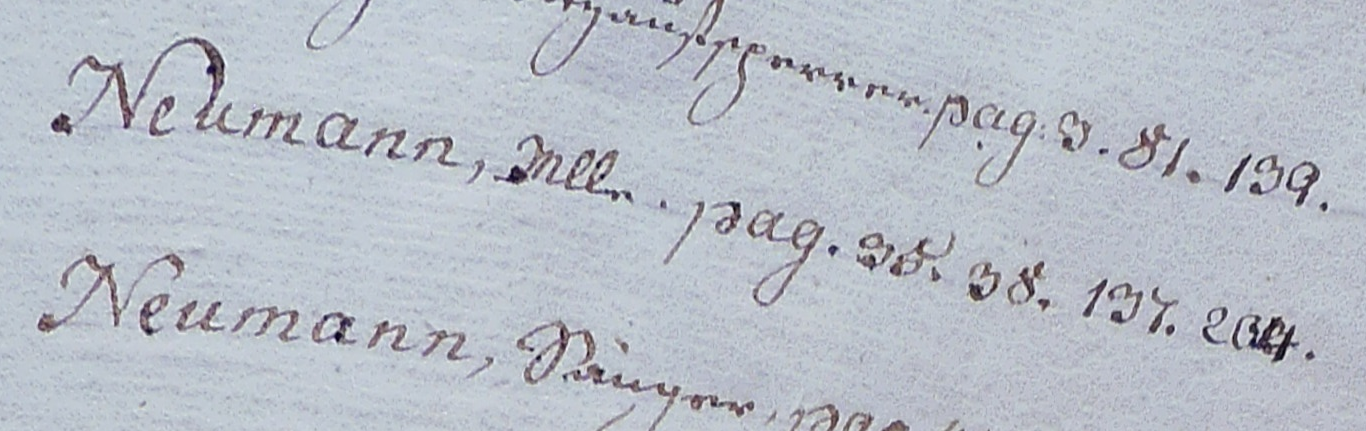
Neumann, Mlle. pag. 35. 38. 137. 204.
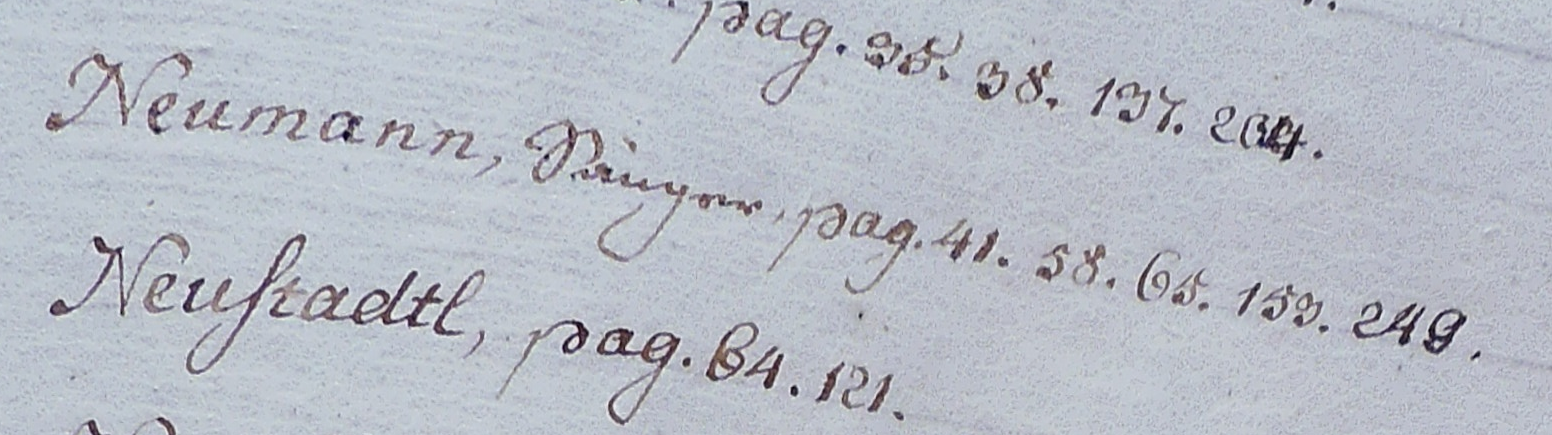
Neumann, Sänger, pag. 41. 58. 65. 153. 249.
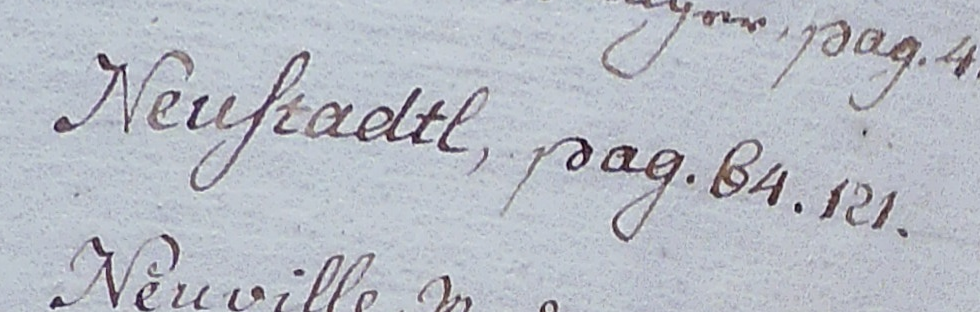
Neustadtl, pag. 64. 121.
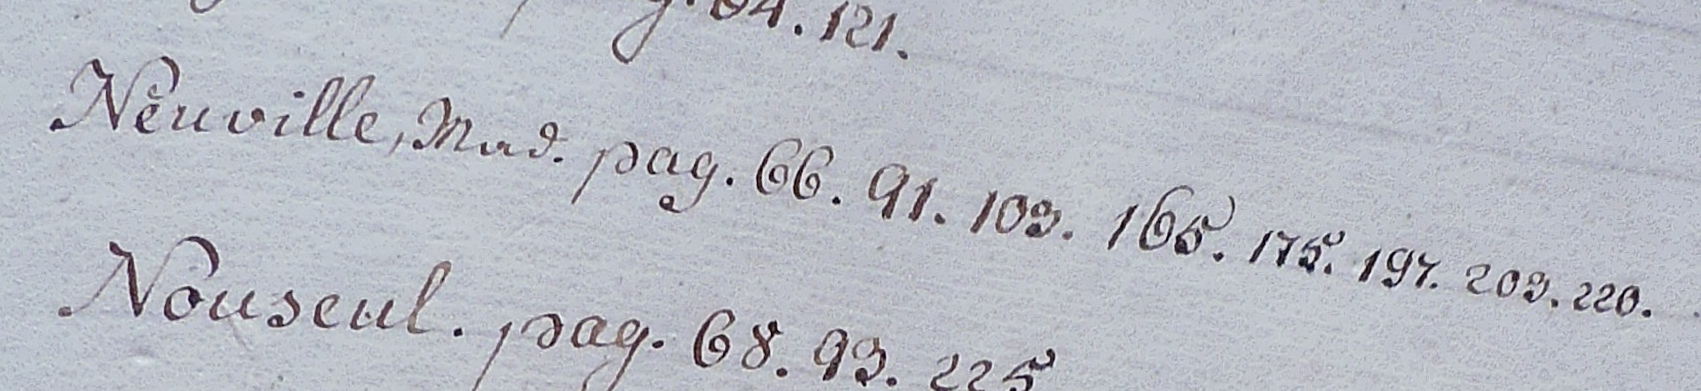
Neuville, Mad. pag. 66. 91. 103. 165. 175. 197. 203. 220.
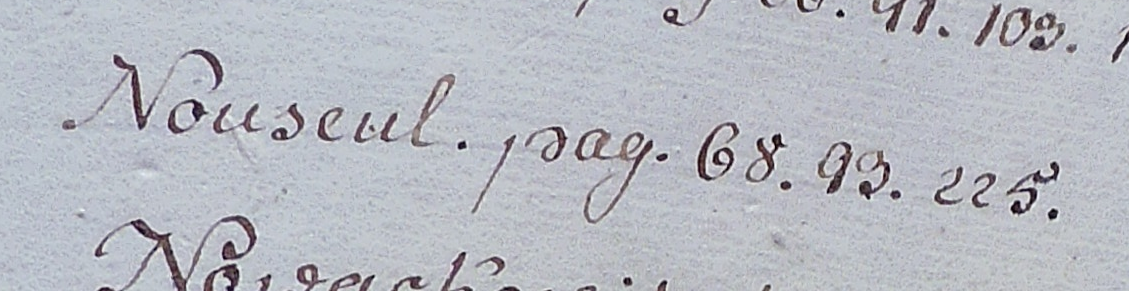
Nouseul. pag. 68. 93. 225.
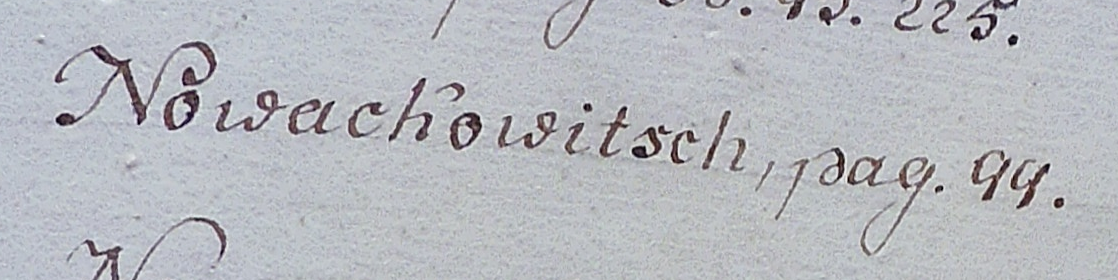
Nowackowitsch, pag. 99.
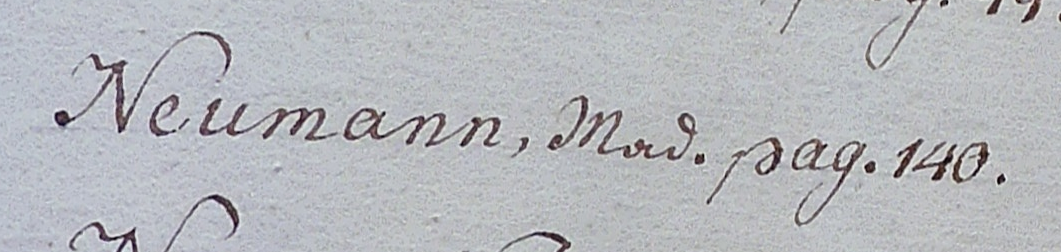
Neumann, Mad. pag. 140.
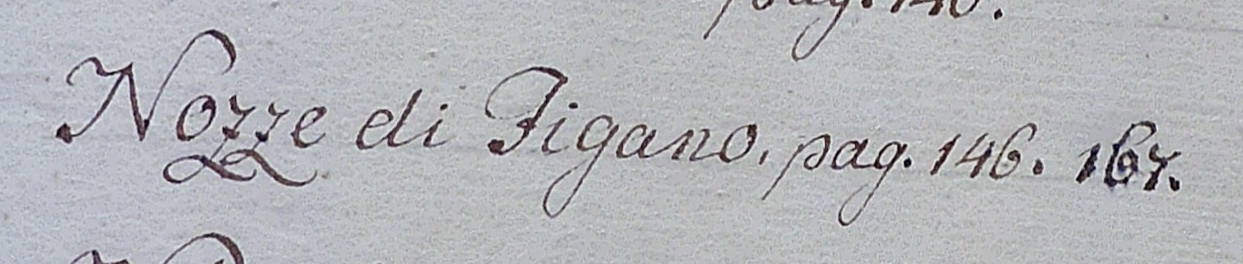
Nozze di Figano, pag. 146. 167.
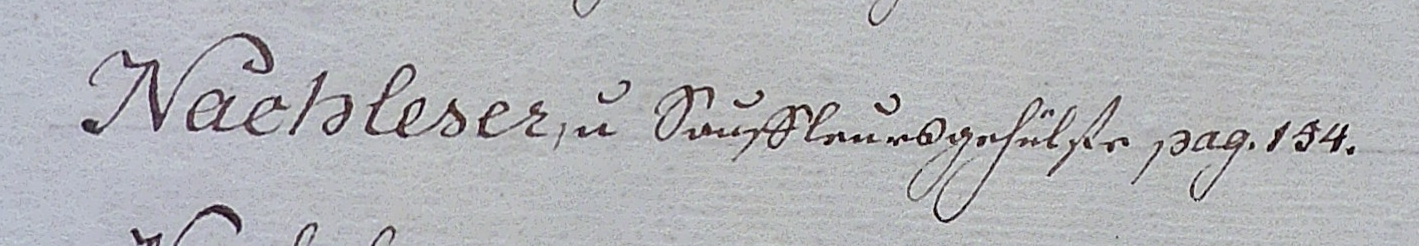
Nachleser, u Souffleursgehülfe pag. 154.
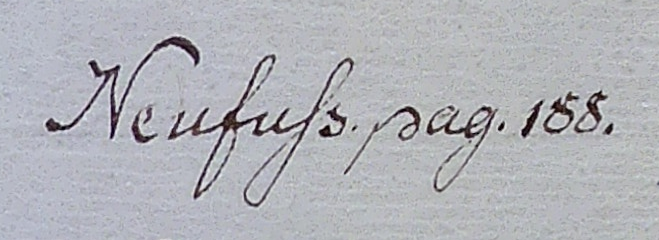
Neufuss. pag 188.
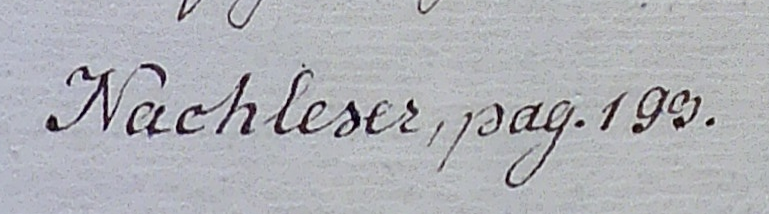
Nachleser, pag. 193.
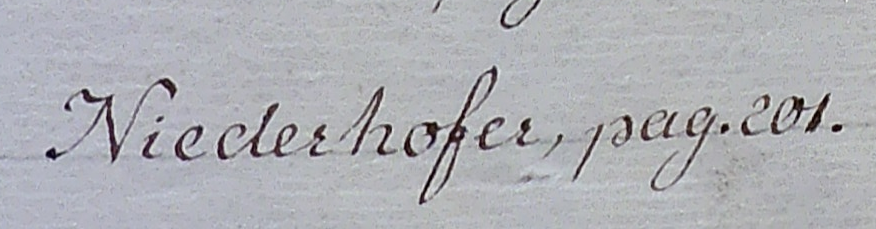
Niederhofer, pag. 201.
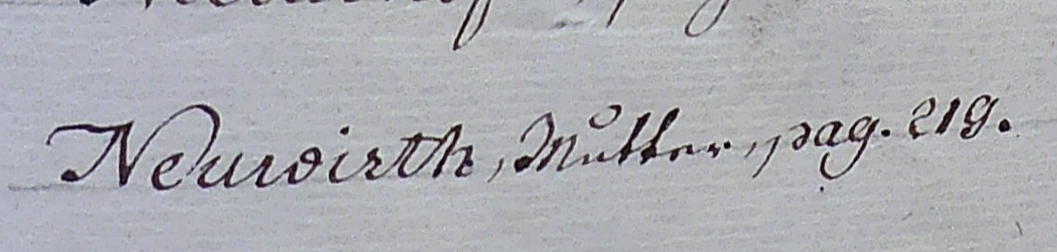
Neuwirth, Mutter, pag. 219.
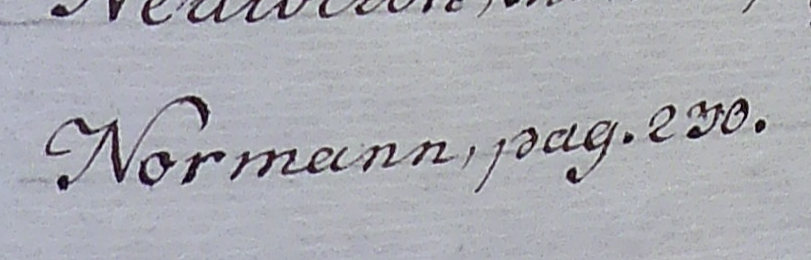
Normann, pag. 230.
